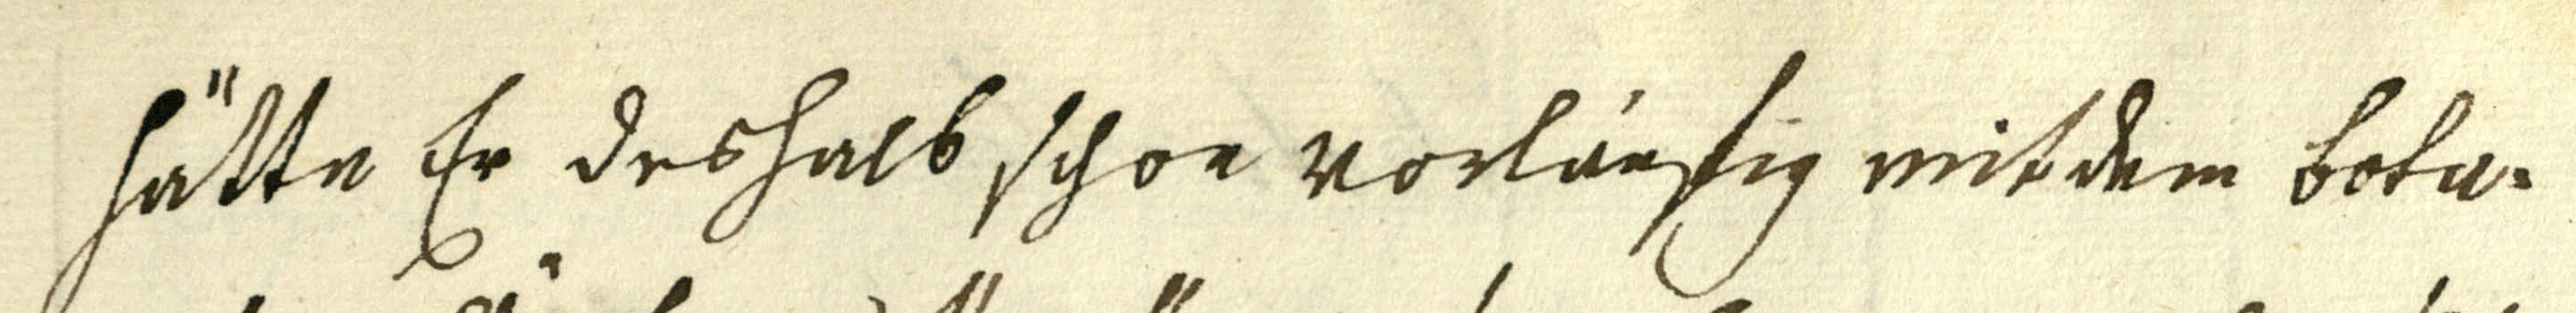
hätte Er deshalb schon vorläufig mit dem Bota¬
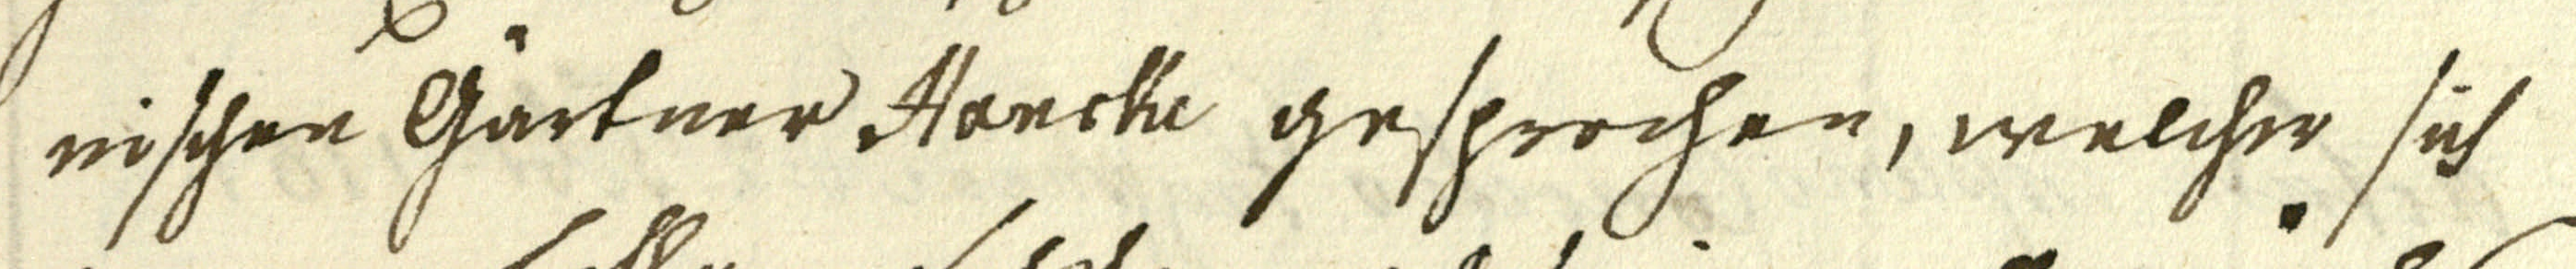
nischen Gärtner Hancke gesprochen, welcher sich
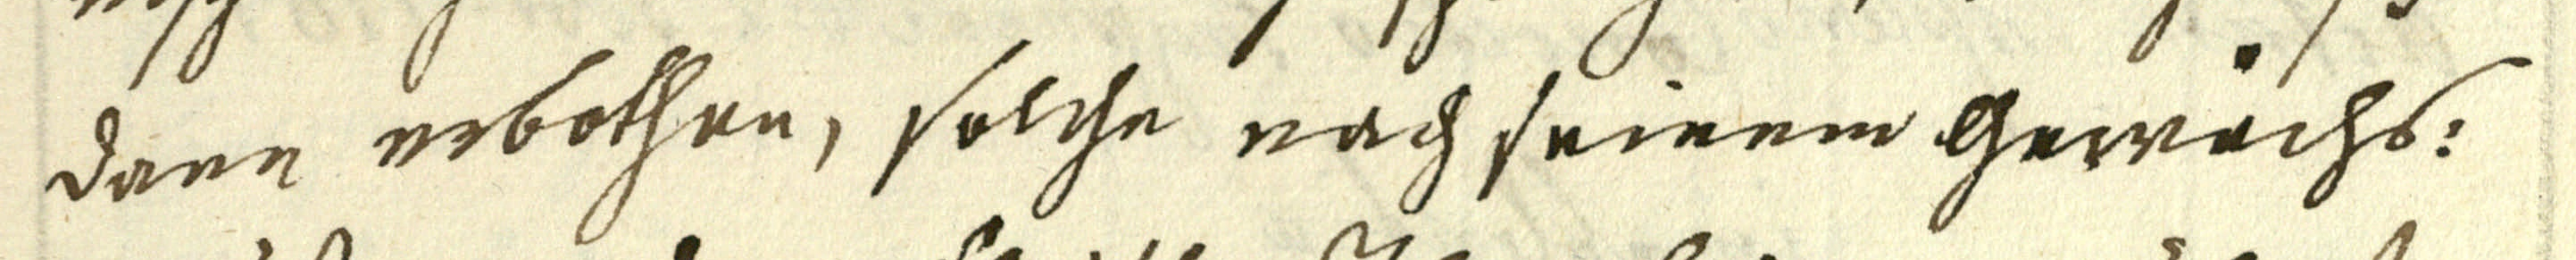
dann erbothen, solche nach seinem Gewächs¬
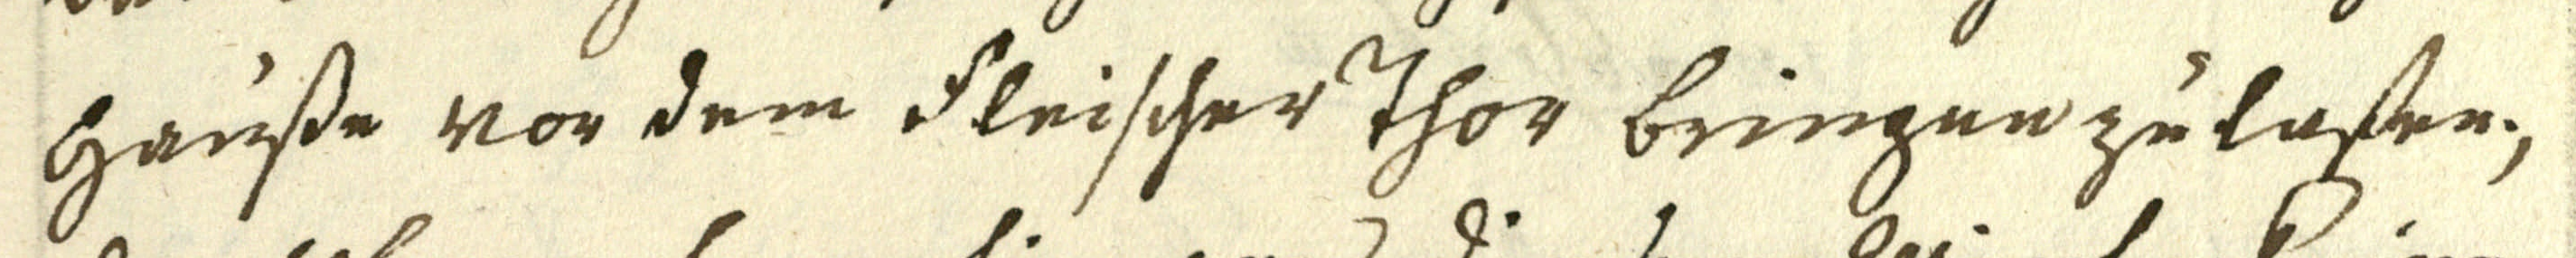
Hauße vor dem Fleischer Thor bringen zu laßen,
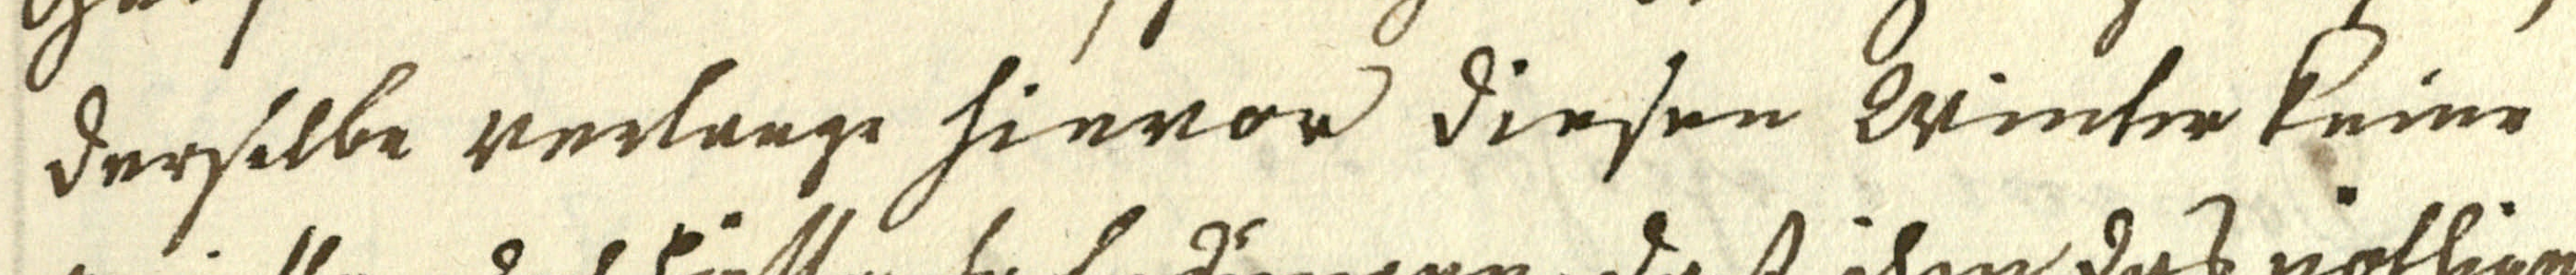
derselbe verlange hievor diesen Winter keine
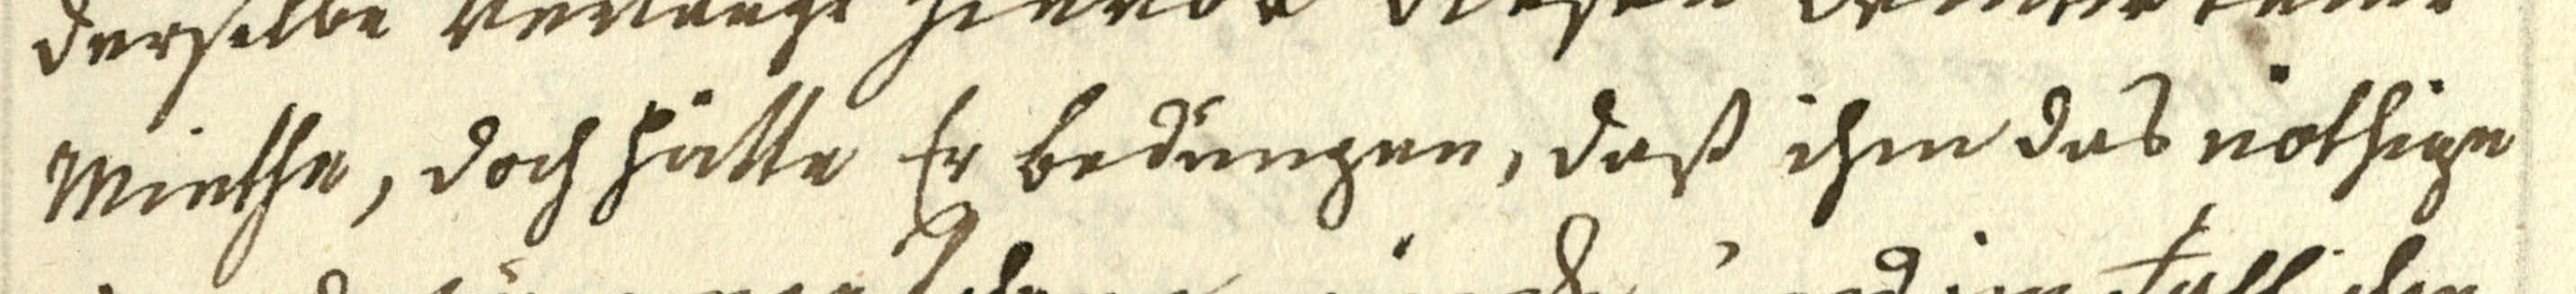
Miethe, doch hätte Er bedungen, daß ihm das nöthige
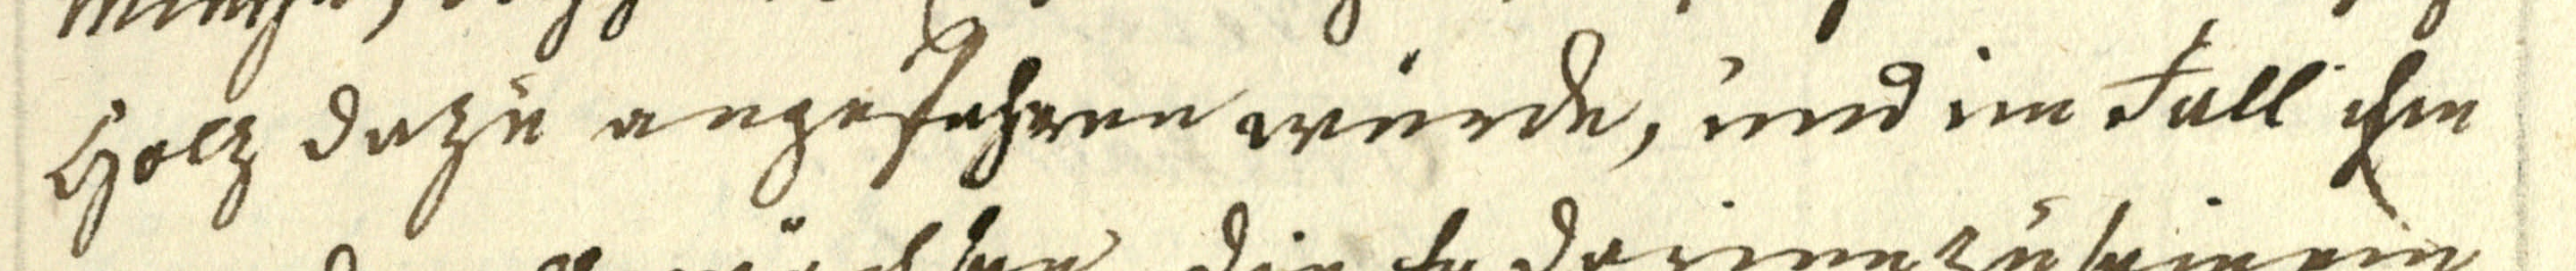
Holz dazu angefahren würde, und im Fall ihm
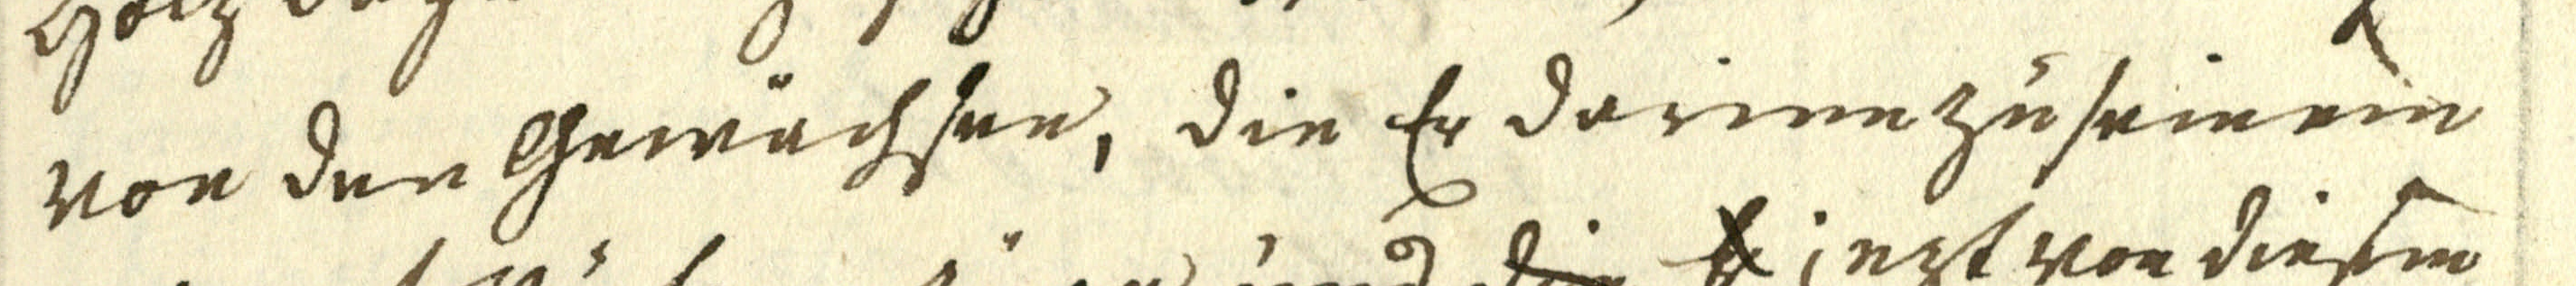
von den Gewächsen, die Er darin zu seinem
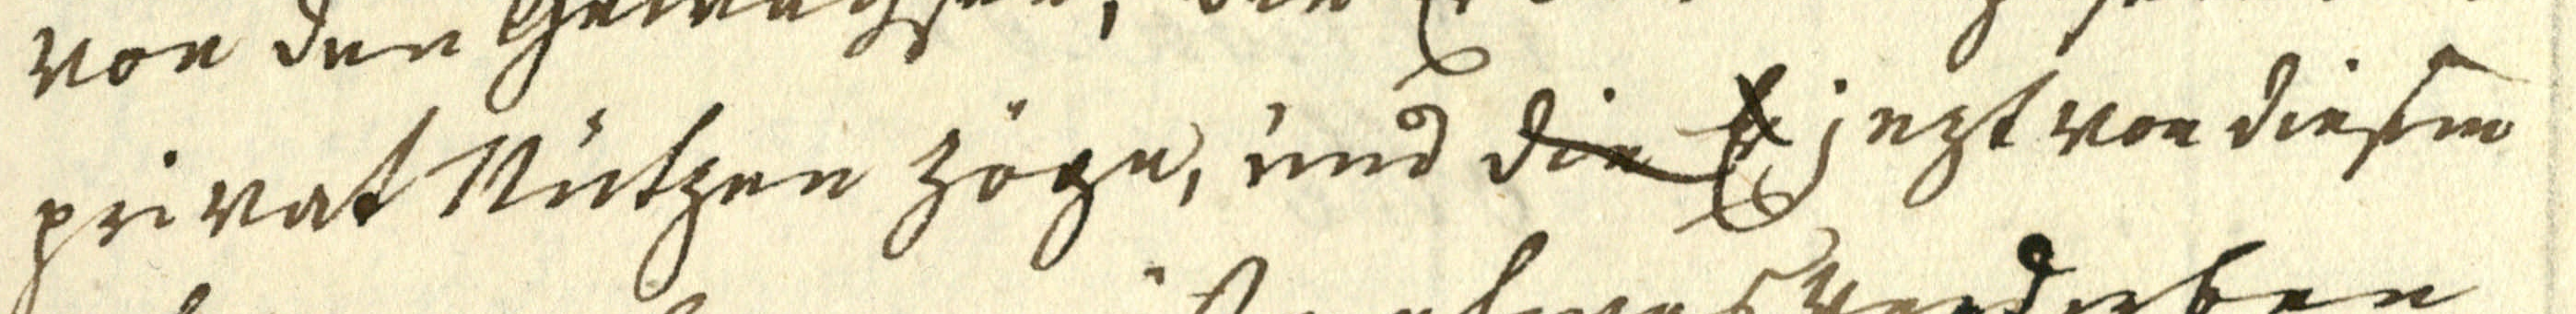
privat Nutzen zöge, und die Er jezt von diesem
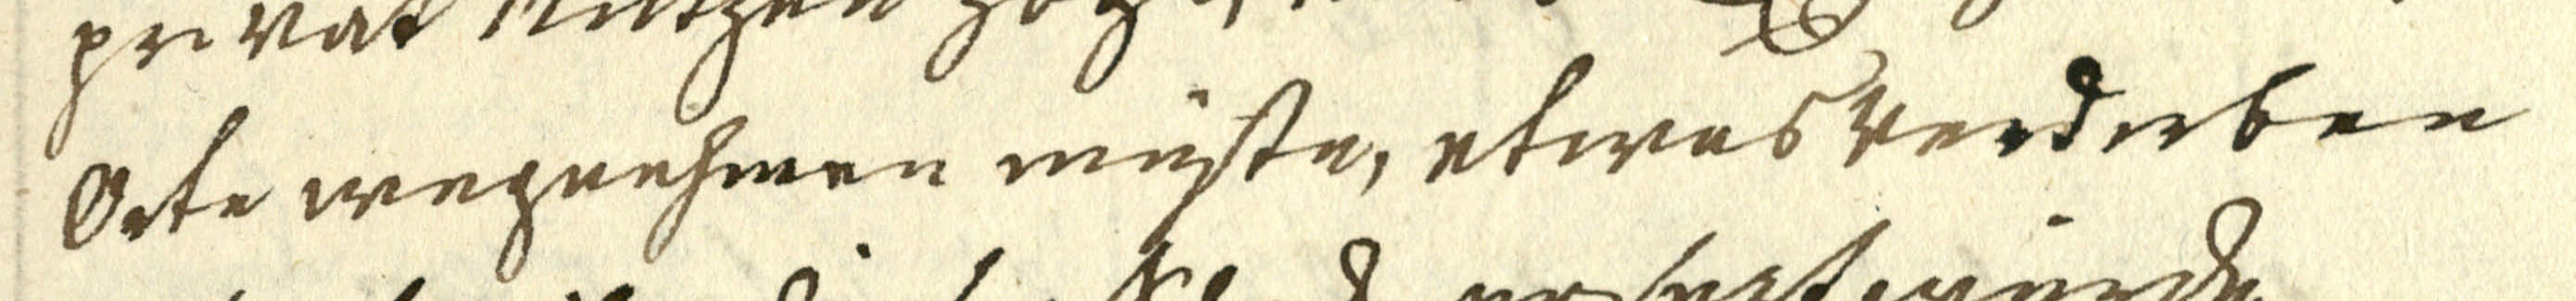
Orte wegnehmen müste, etwas verderben
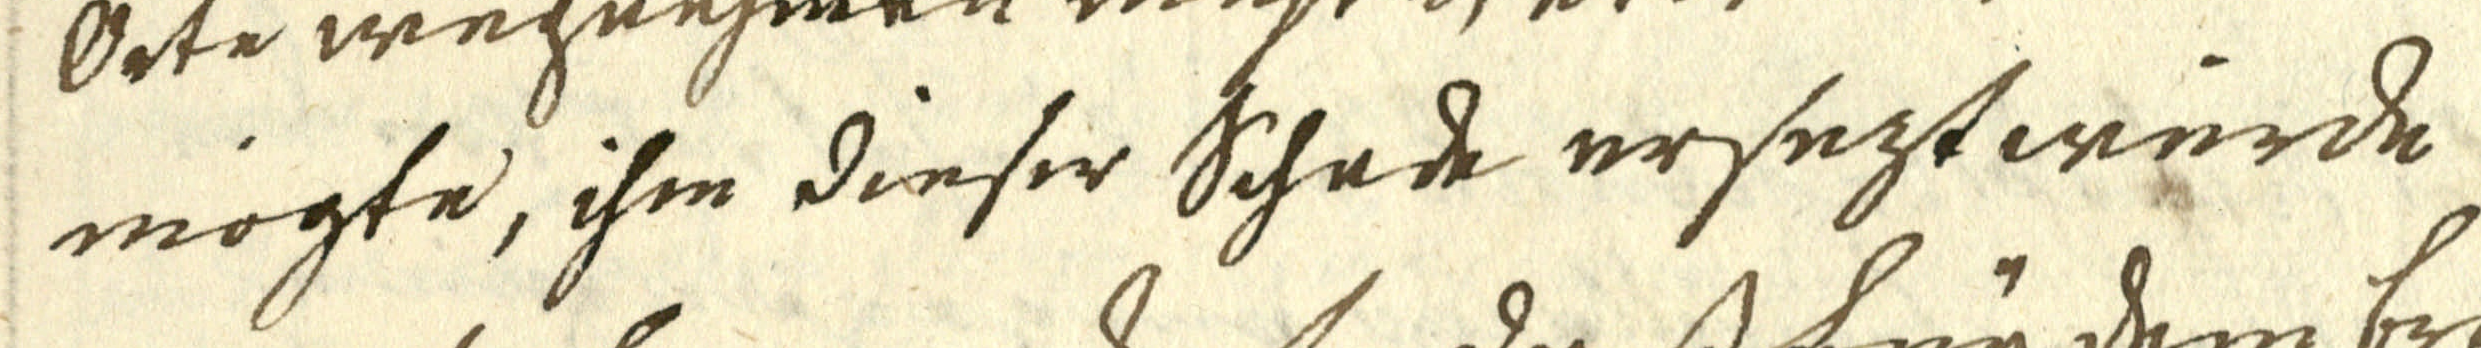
mögte, ihm dieser Schade ersezt würde
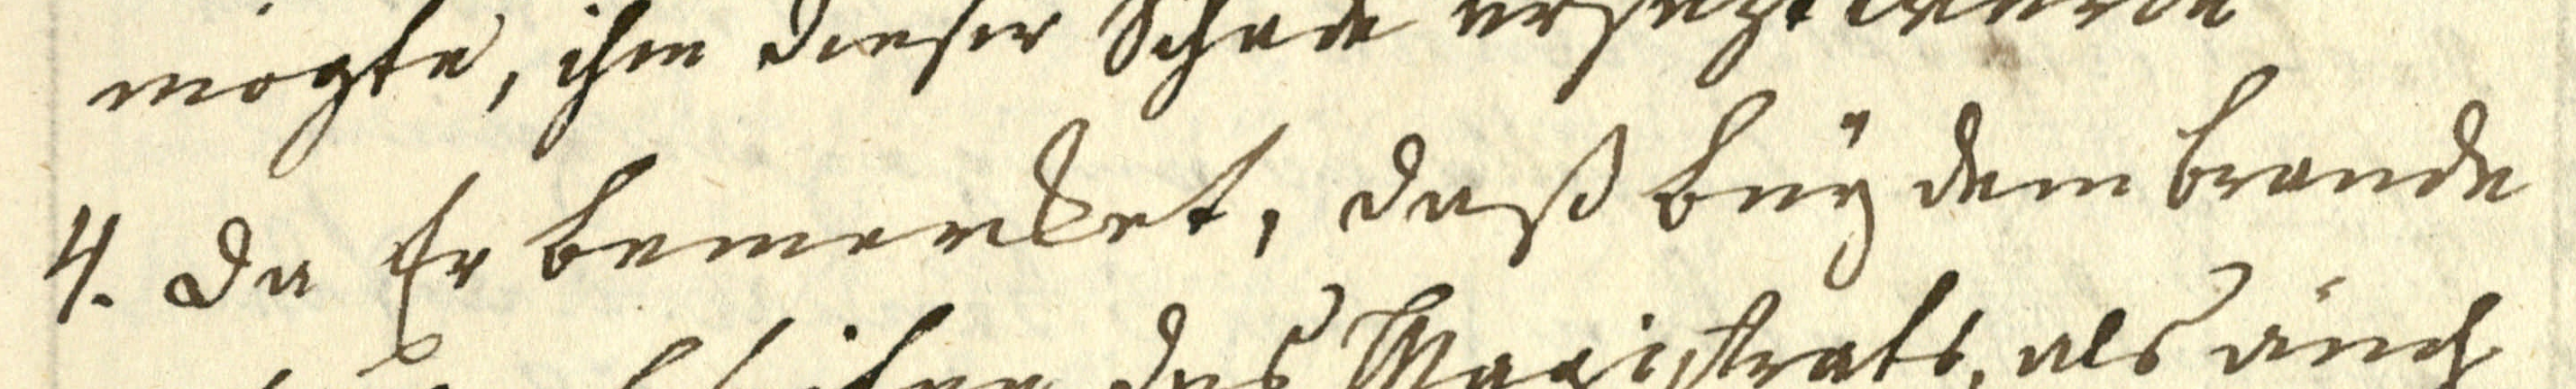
4. Da Er bemerket, daß beÿ dem Brande
